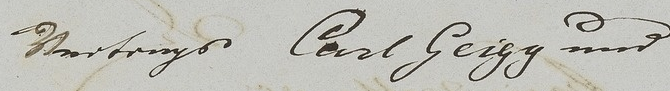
Vertrages Carl Geigy und
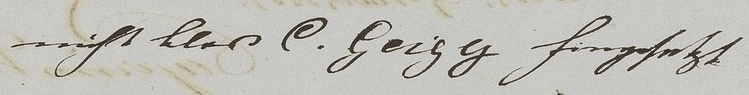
nicht blos C. Geigy hingesetzt
